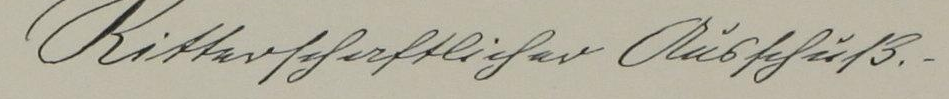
Ritterschaftlicher Ausschuß.
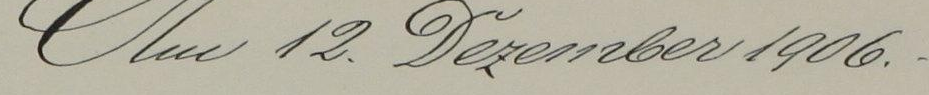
Am 12. Dezember 1906.
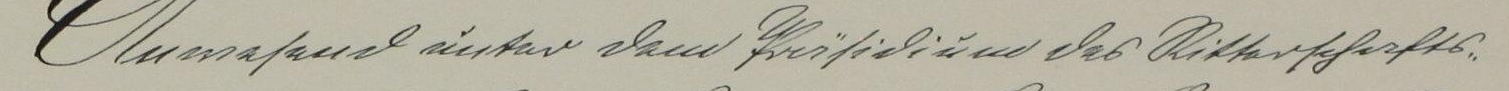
Anwesend unter dem Präsidium des Ritterschafts-
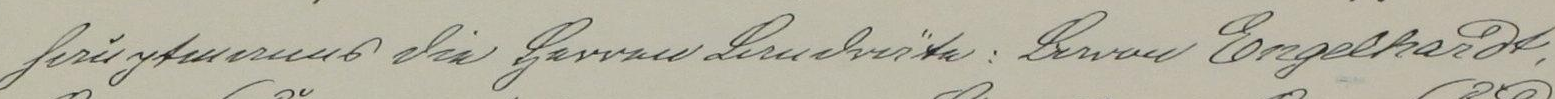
hauptmanns die Herren Landräte: Baron Engelhardt,
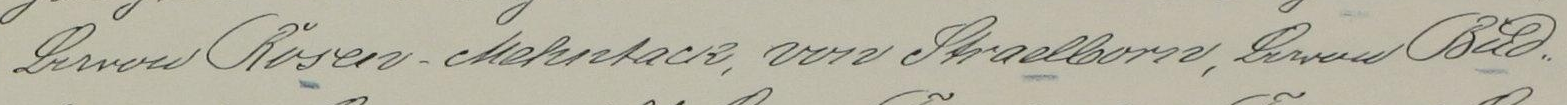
Baron Rosen-Mehntack, von Straelborn, Baron Bud-
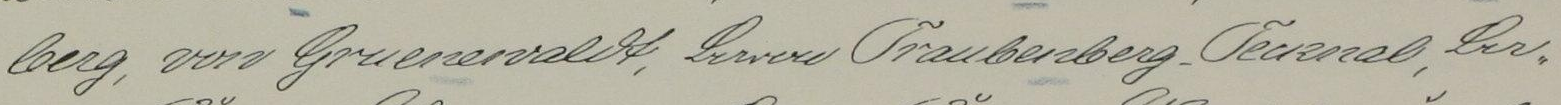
berg, von Gruenewaldt, Baron Traubenberg-Tecknal, Ba-
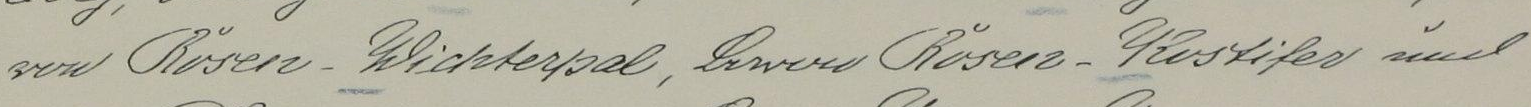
ron Rosen-Wichterpal, Baron Rosen-Kostifer und
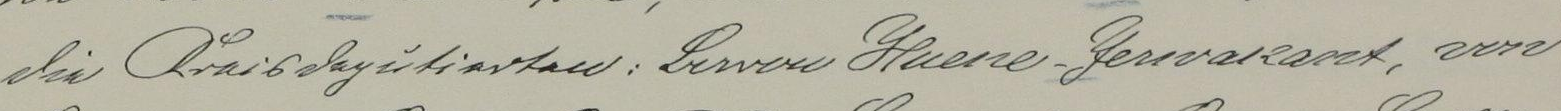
die Kreisdeputierten: Baron Huene-Jerwakant, von
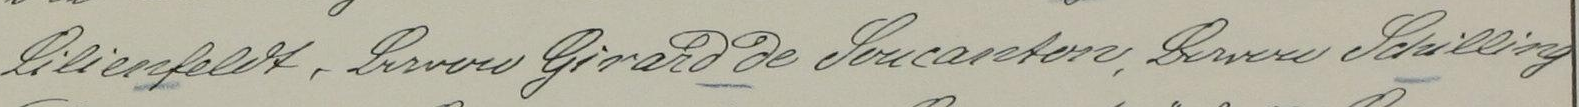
Lilienfeldt, Baron Girard de Soucanton, Baron Schilling-
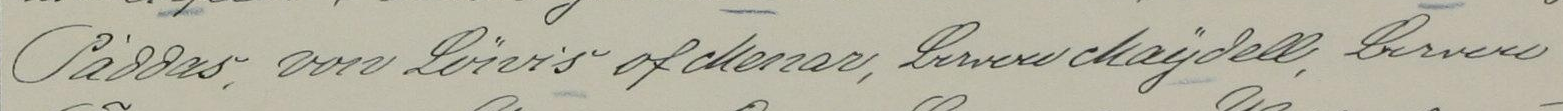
Paddas, von Löwis of Menar, Baron Maydell, Baron
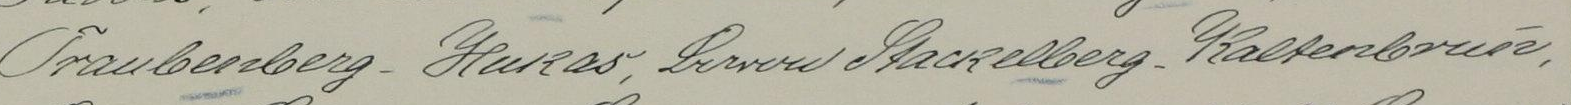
Traubenberg-Hukas, Baron Stackelberg-Kaltenbrunn,
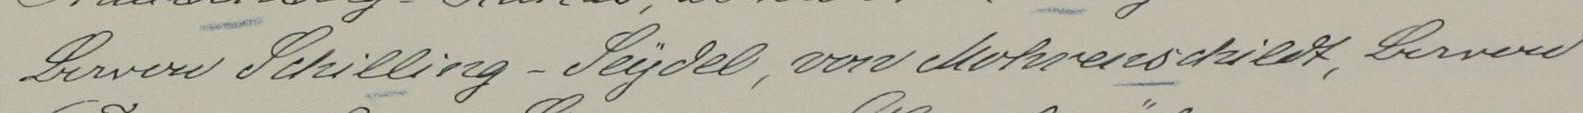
Baron Schilling-Seydel, von Mohrenschildt, Baron
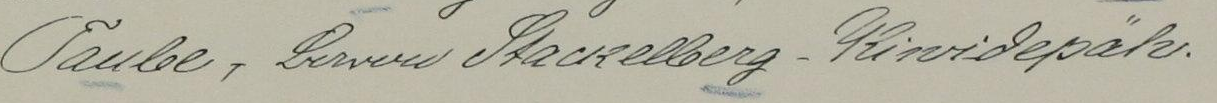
Taube, Baron Stackelberg-Kiwidepäh.
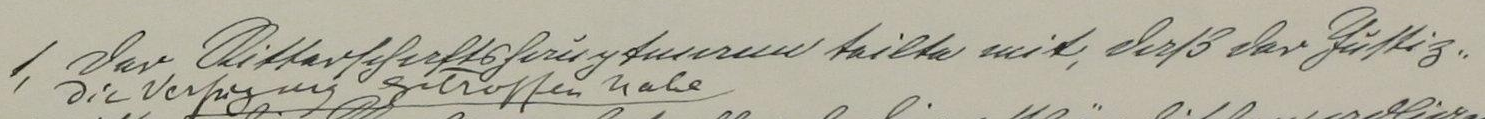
1. Der Ritterschaftshauptmann teilte mit, daß der Justiz-
